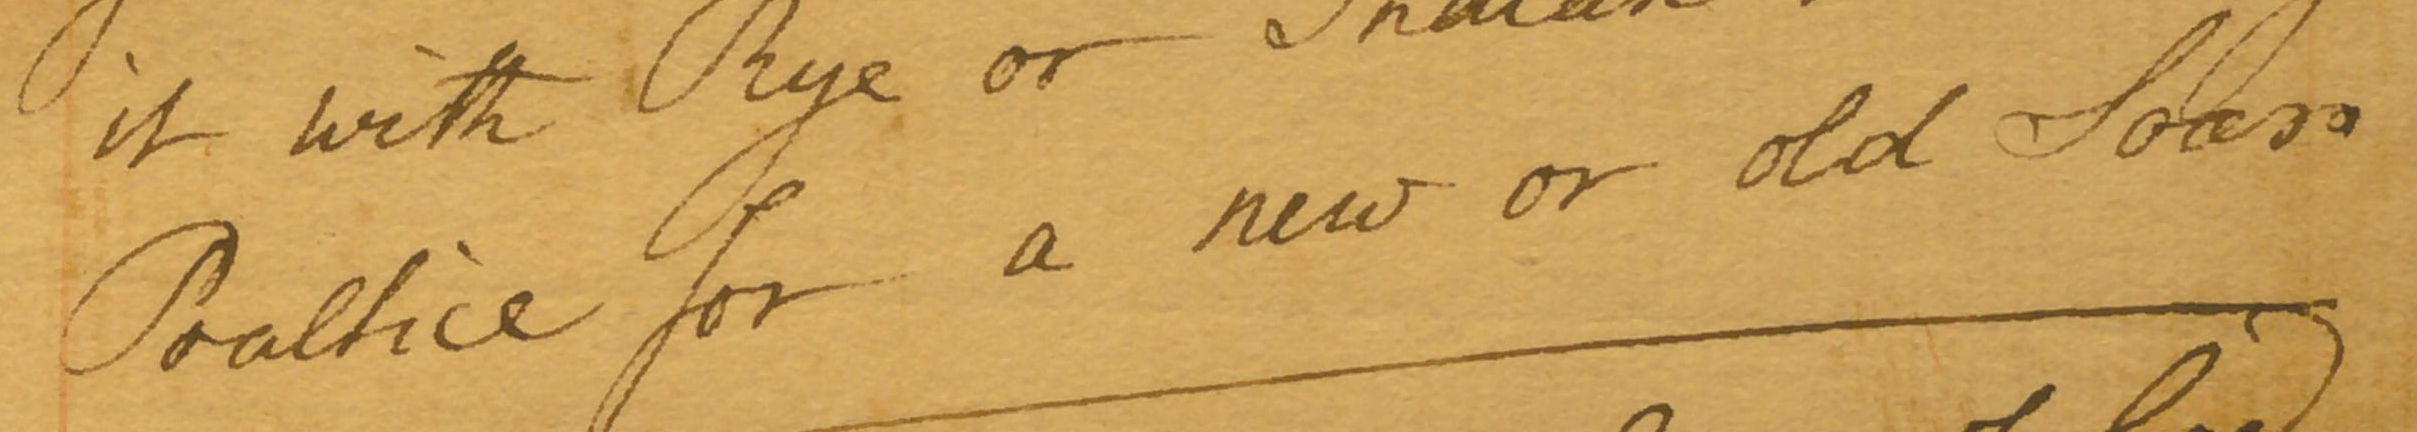Poultice for a new or old Soar
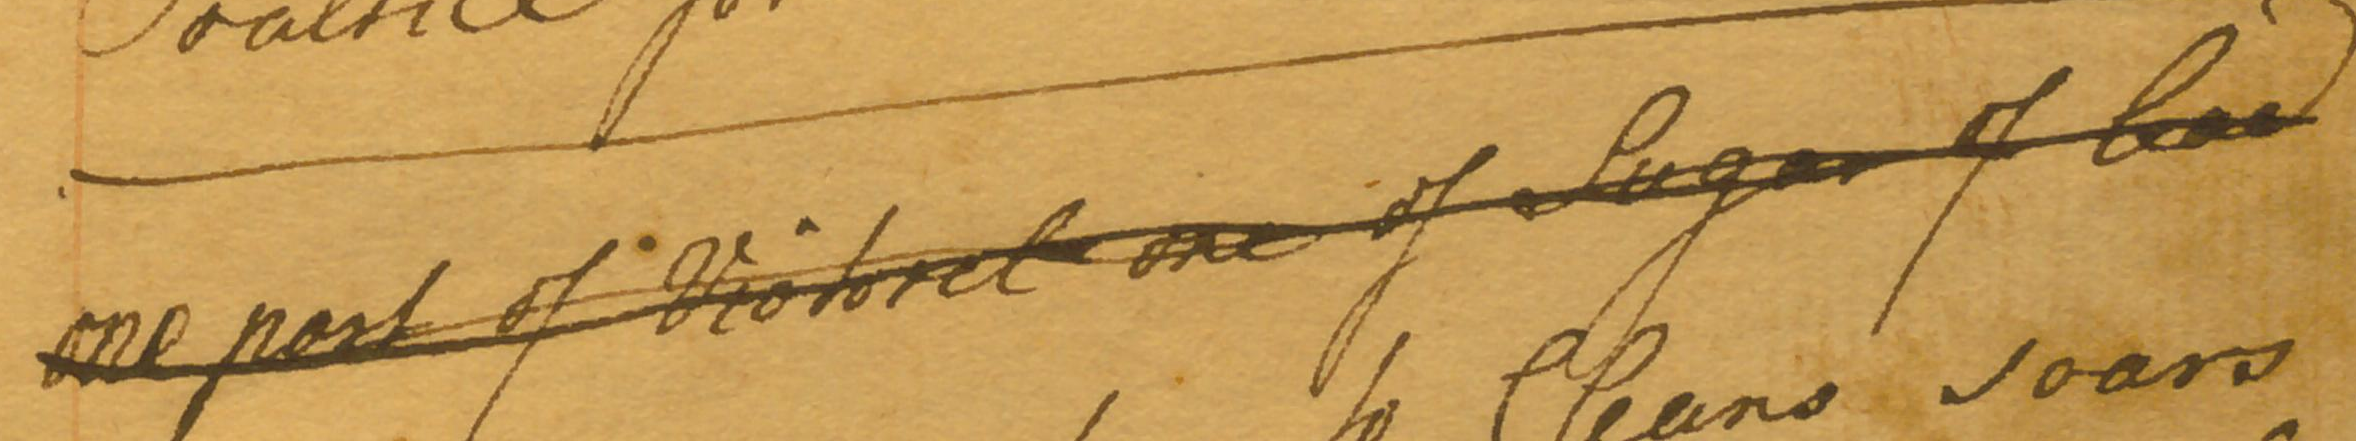[one part of Victrel one of Sugar of lead]
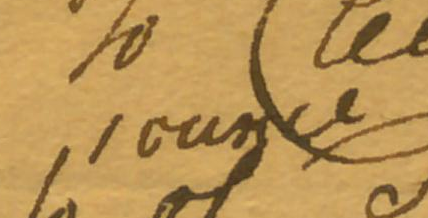1 ounce
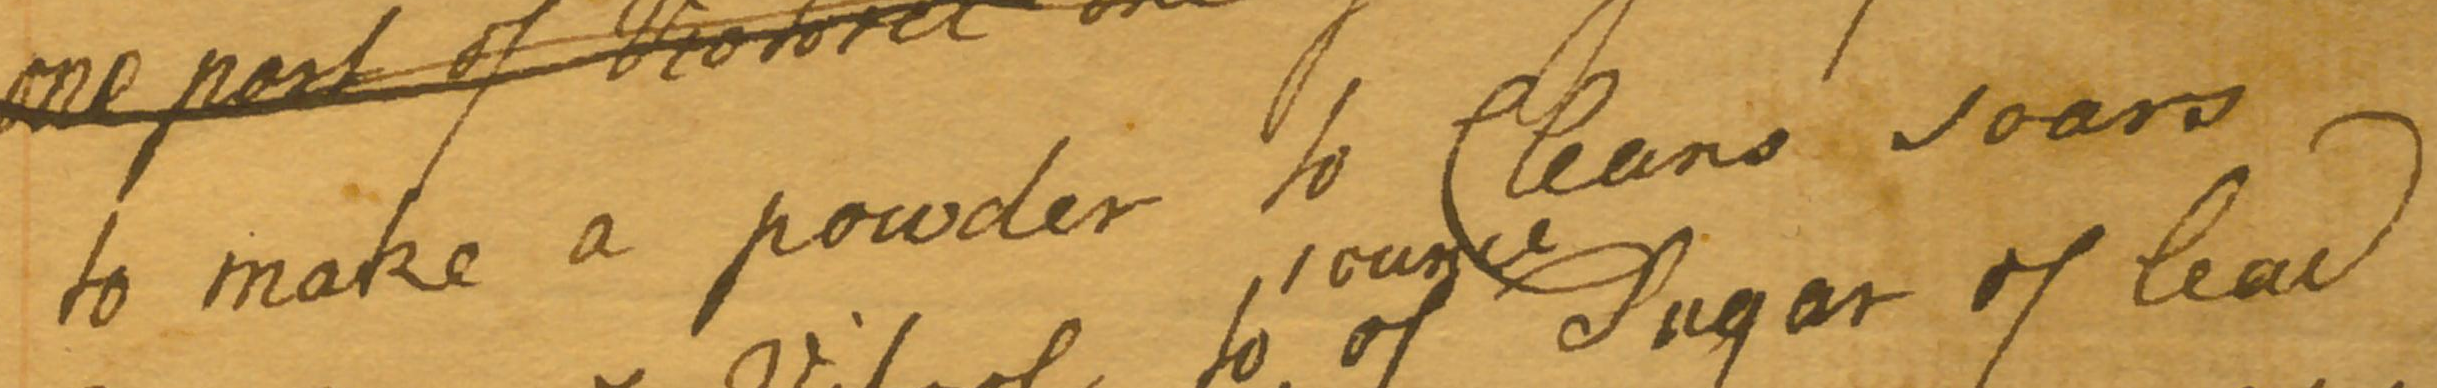to make a powder to Cleans soars
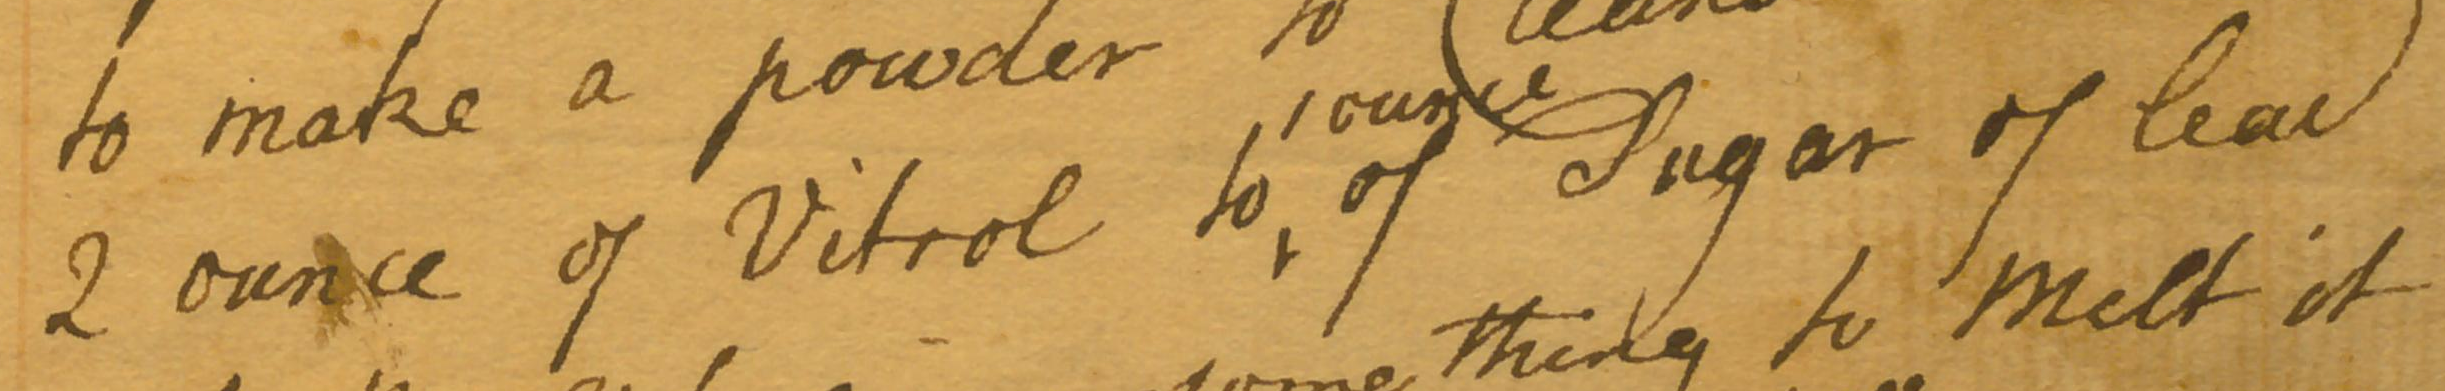2 ounce of Vitrol to ^ of sugar of lead
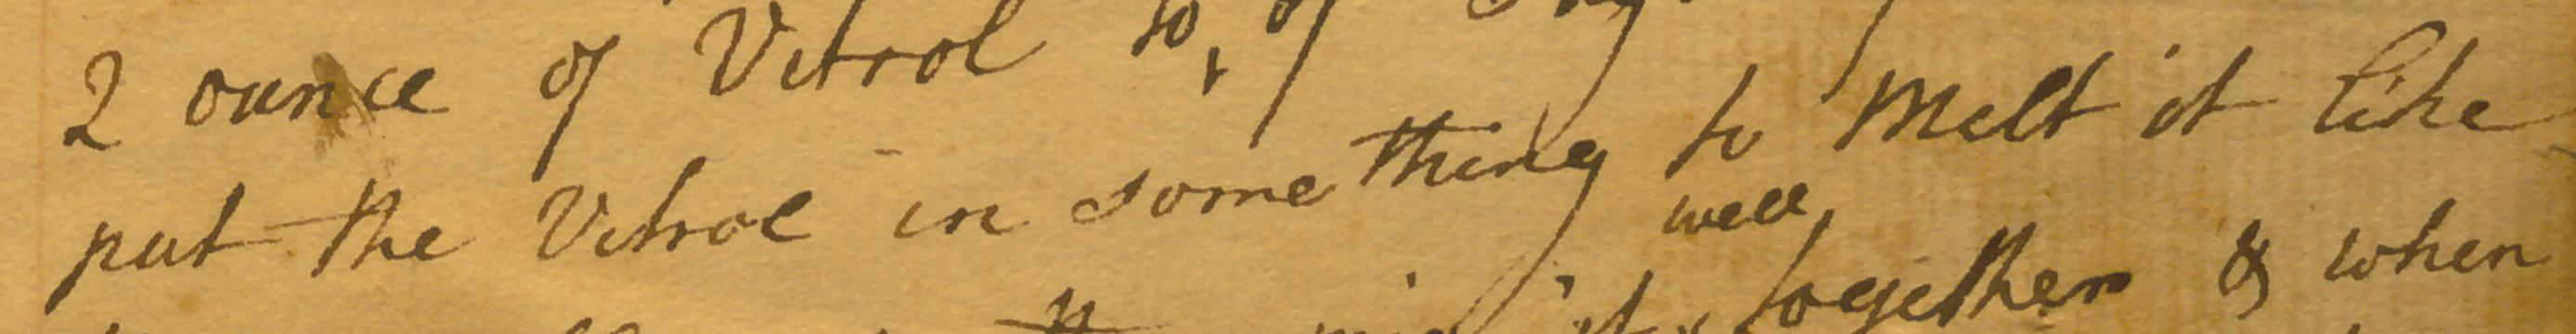put the Vitrol in something to Melt it like
